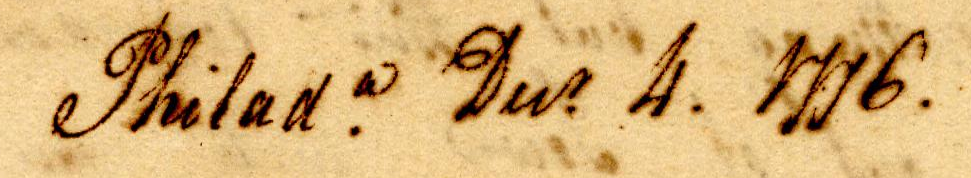Philad^a. Dec^r. 4. 1776.
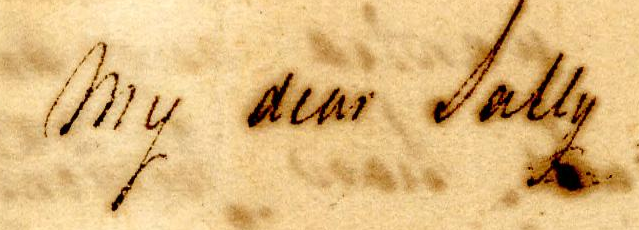My dear Sally
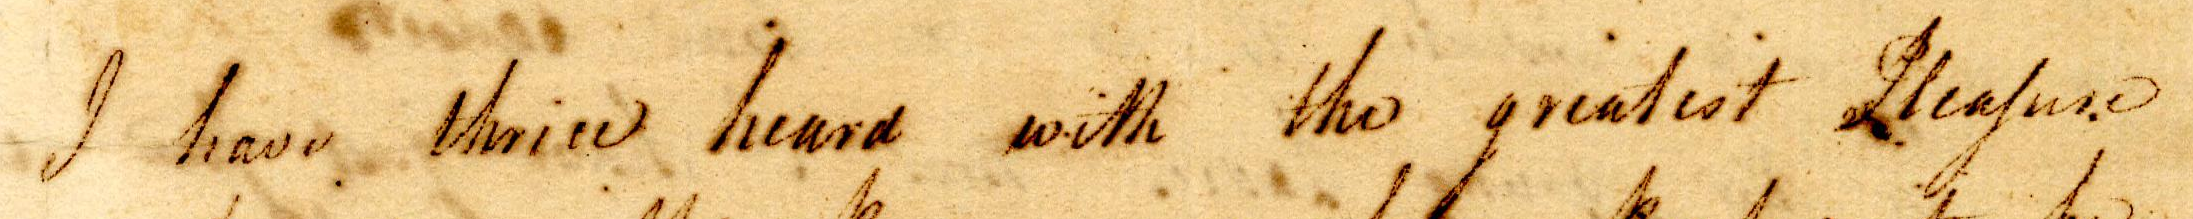I have thrice heard with the greatest Pleasure
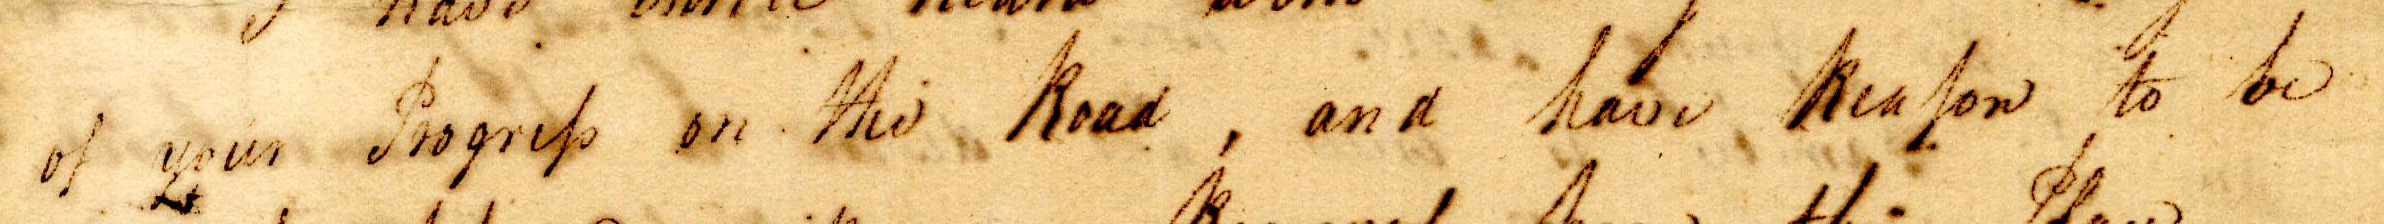of your Progress on the Road, and have Reason to be
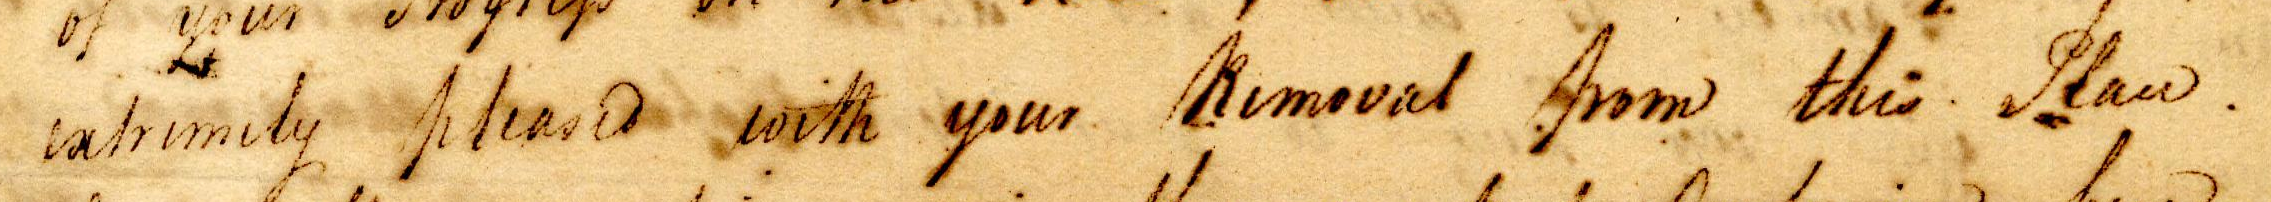extremely pleased with your Removal from this Place.
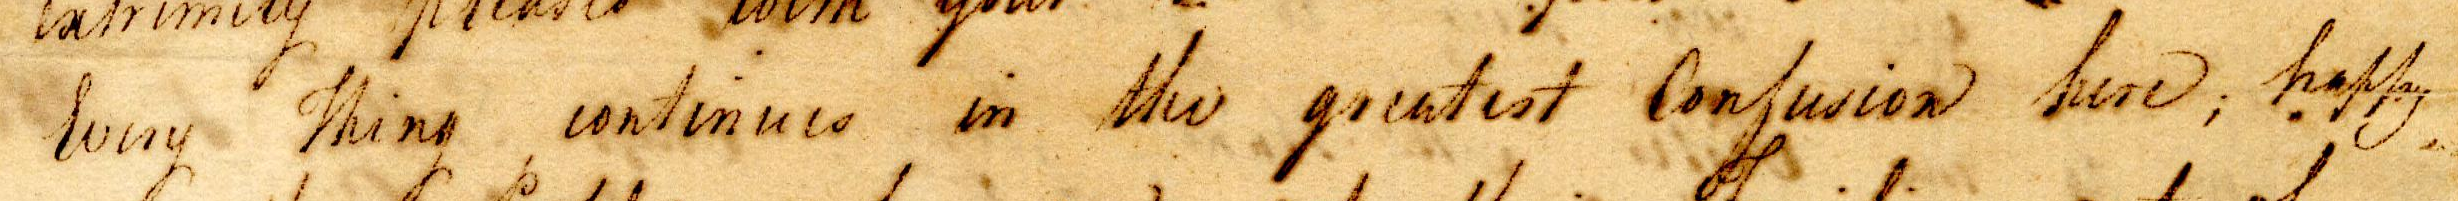Every thing continues in the greatest Confusion here; happy
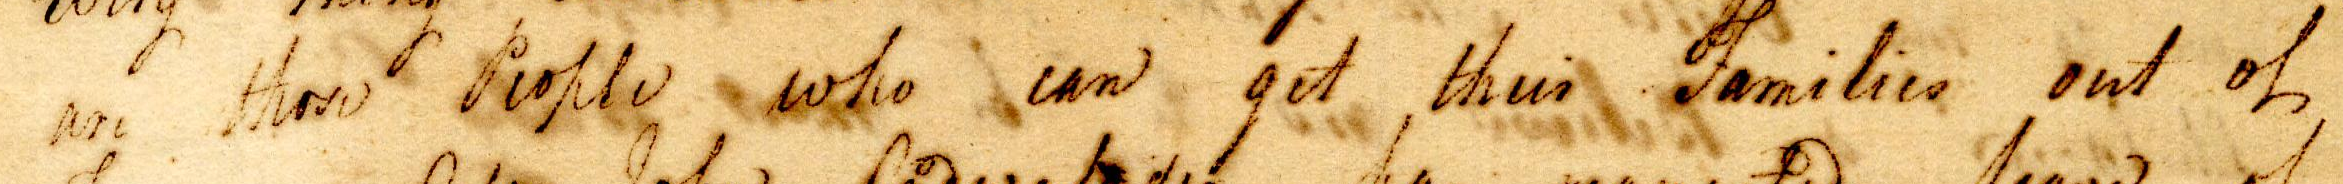are those People who can get their Families out of
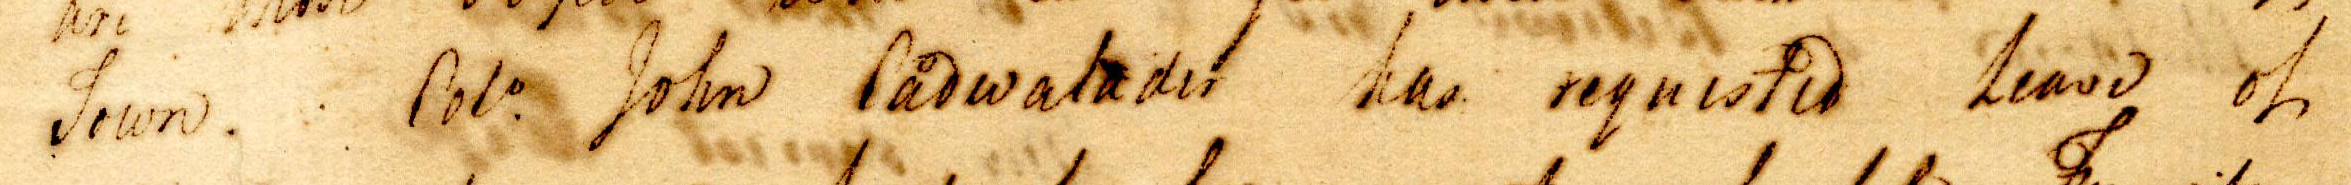Town. Col^o. John Cadwalader has requested Leave of
